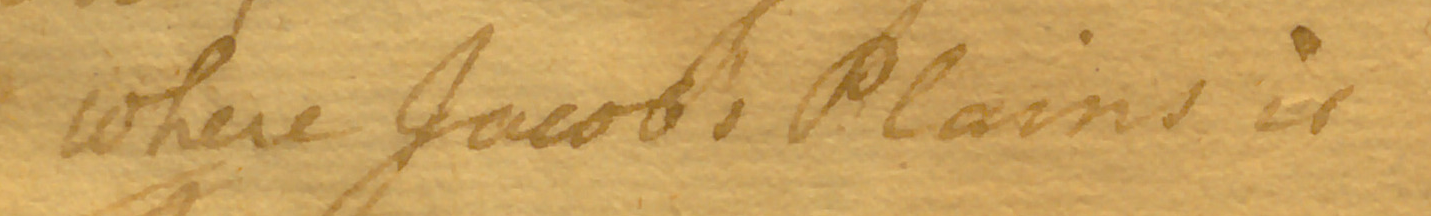where Jacob's Plains is
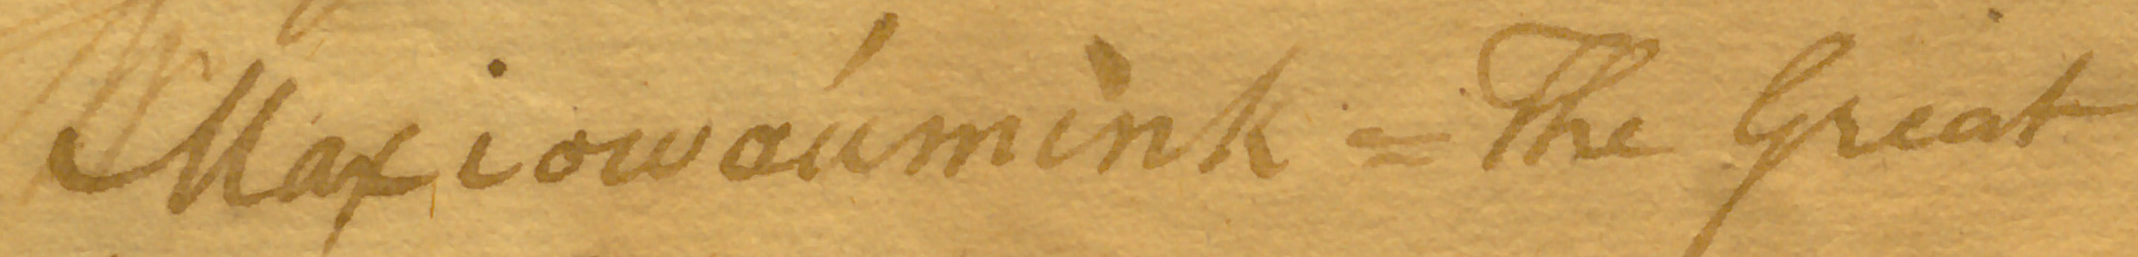Maxiowáumink = The Great
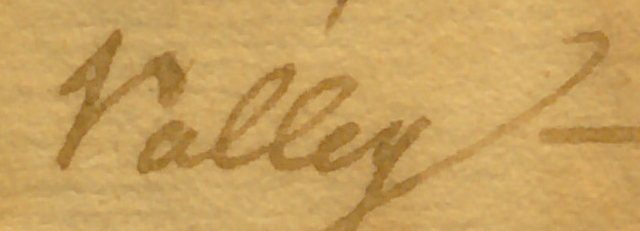Valley-
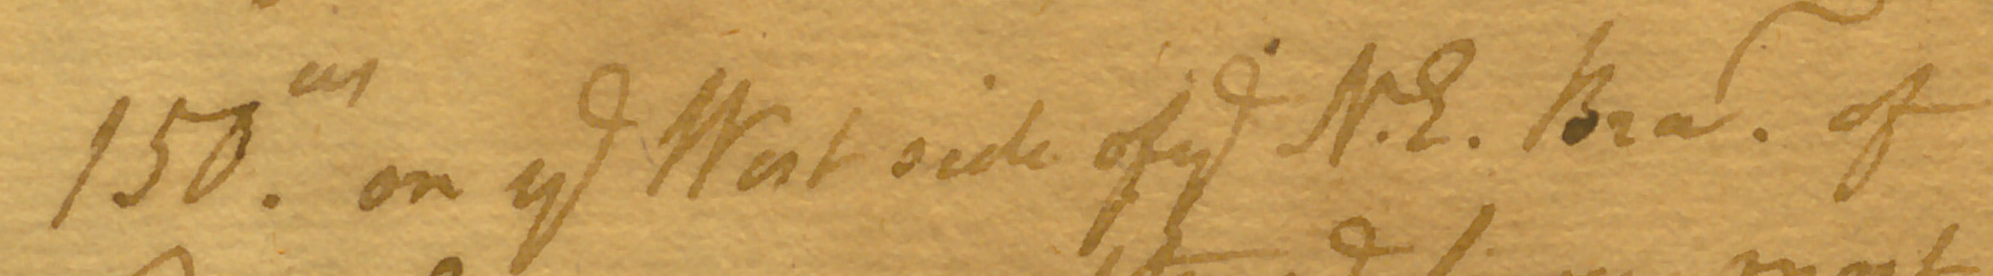150.^as on y^e West side of y^e N.E. Bra. of
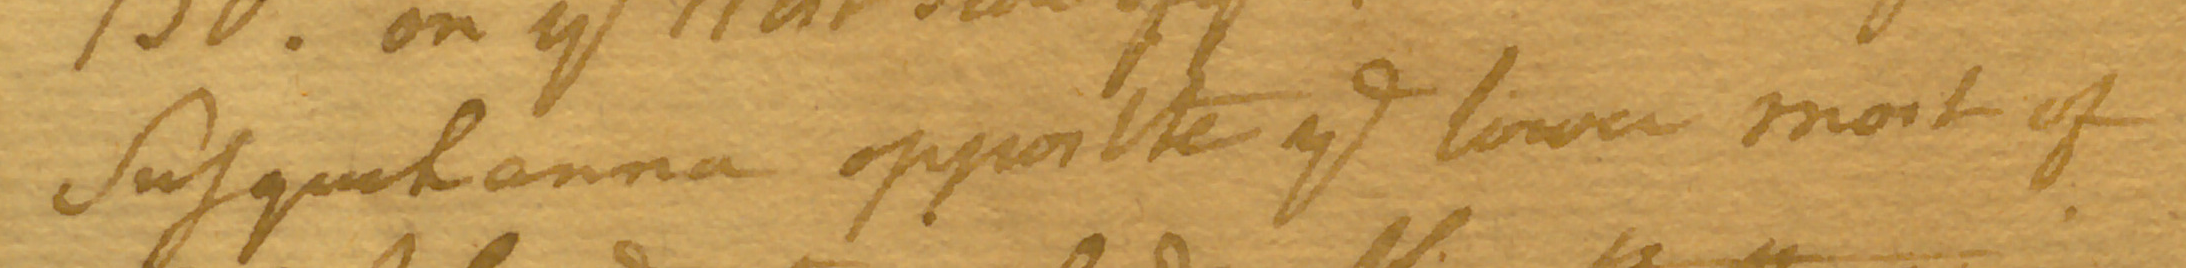Susquehanna opposite y^e lower most of
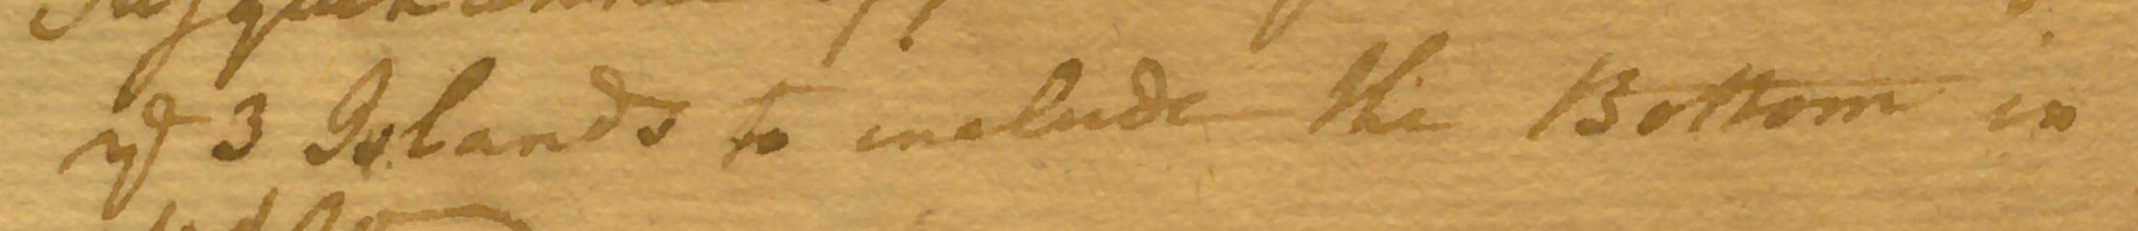y^e 3 Islands to include the Bottom in
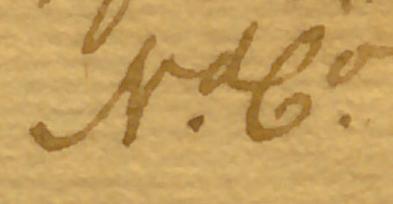N^d. C^o.
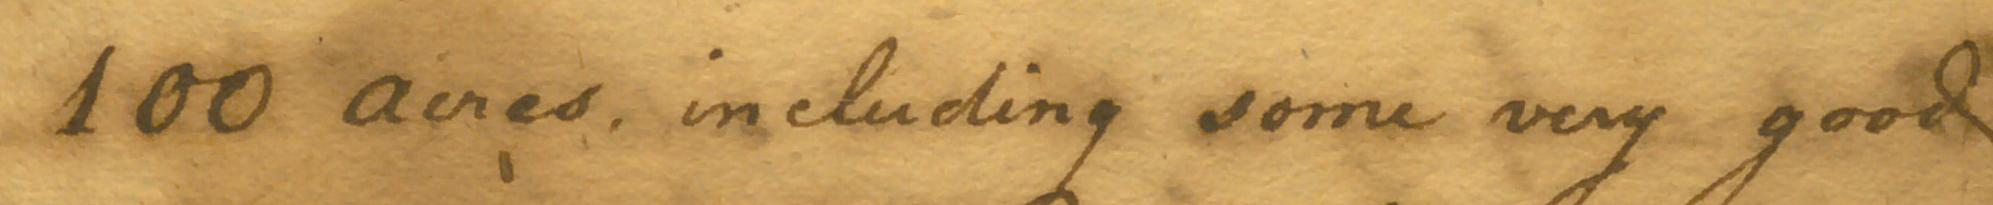100 acres, including some very good
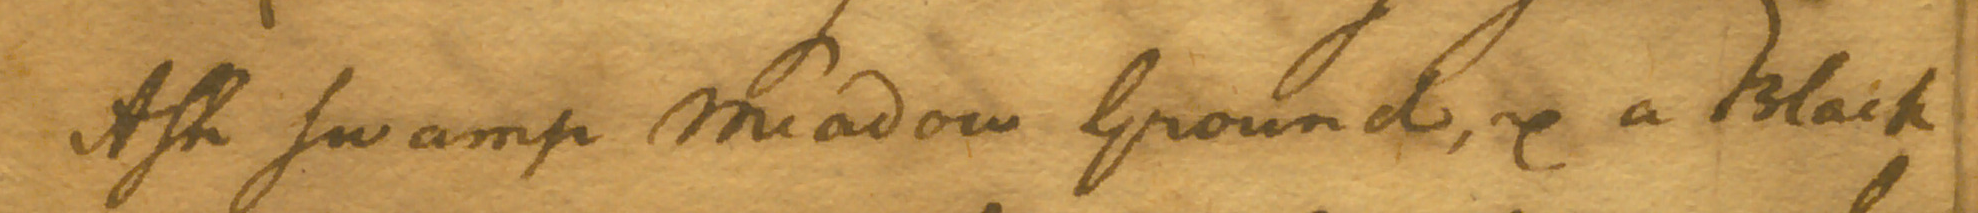Ash swamp meadow Ground, & a Black
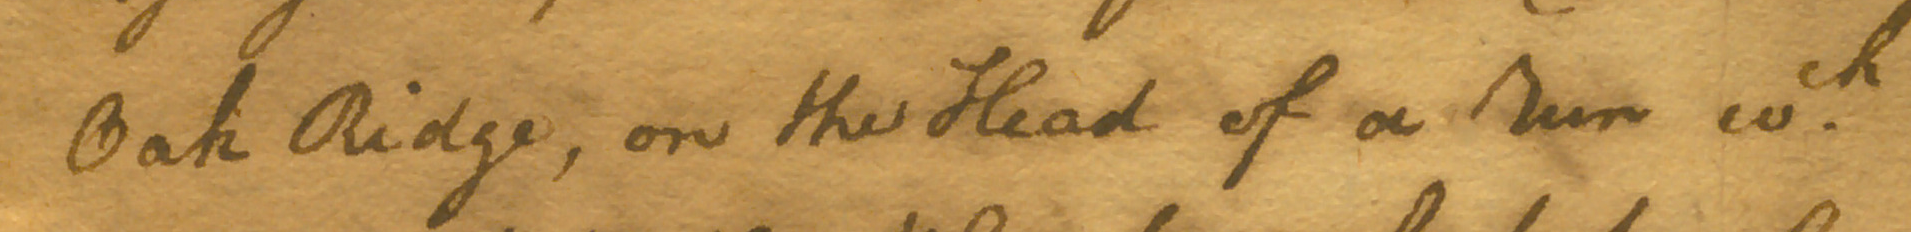Oak Ridge, on the Head of a run w^ch.
